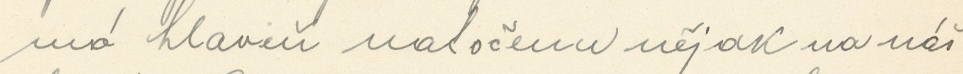má hlaveň natočenu nějak na náš
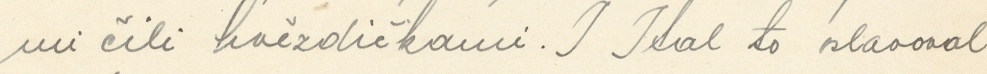mi čili hvězdičkami. I Ital to oslavoval
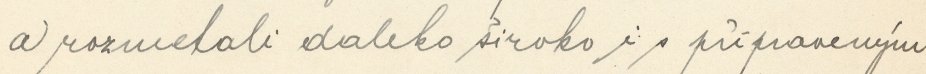a rozmetali daleko široko i s připraveným
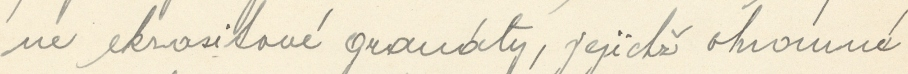ne ekrasitové granáty, jejichž ohromné
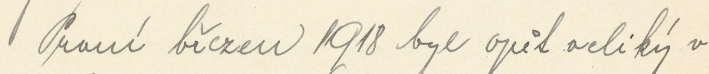První březen 1918 byl opět veliký v
